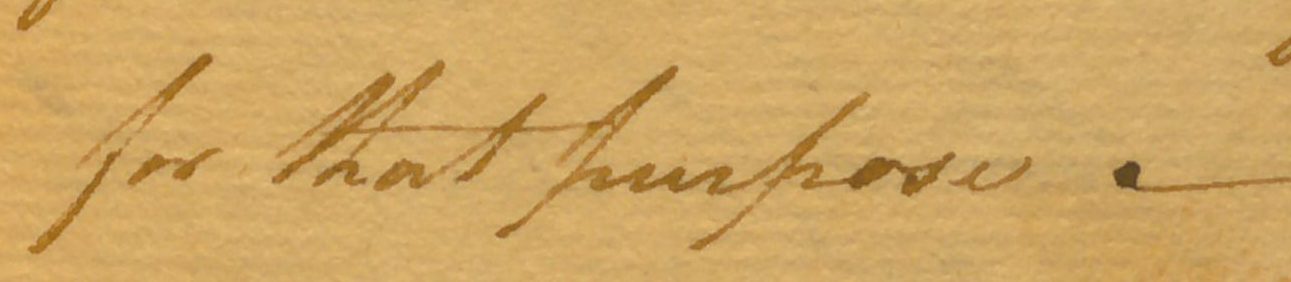for that purpose.
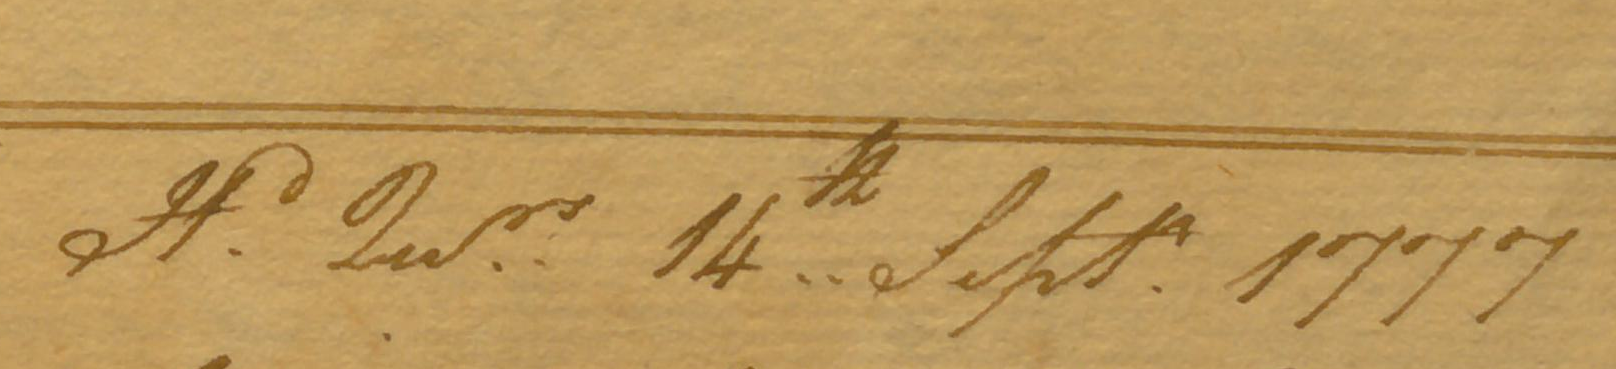H^d. Qu^rs. 14^th. Sept^r. 1777
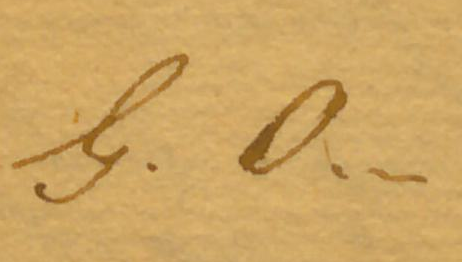G.O.-
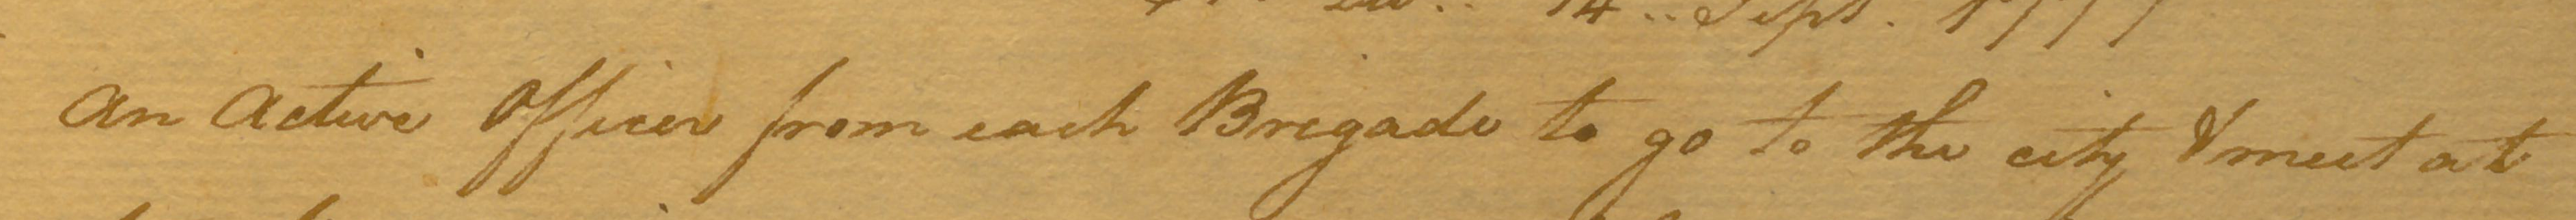An Active officer from each Brigade to go to the city & meet at
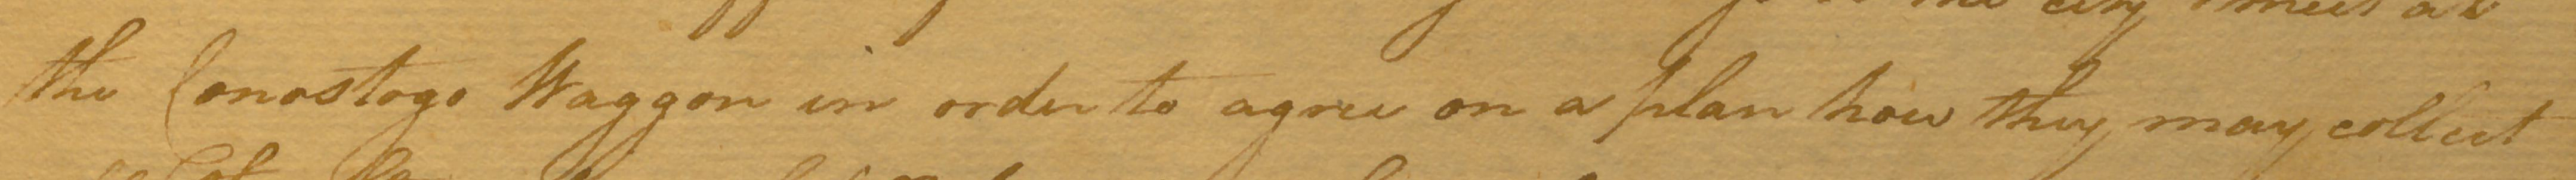the Conestoga Waggon in order to agree on a plan how they may collect
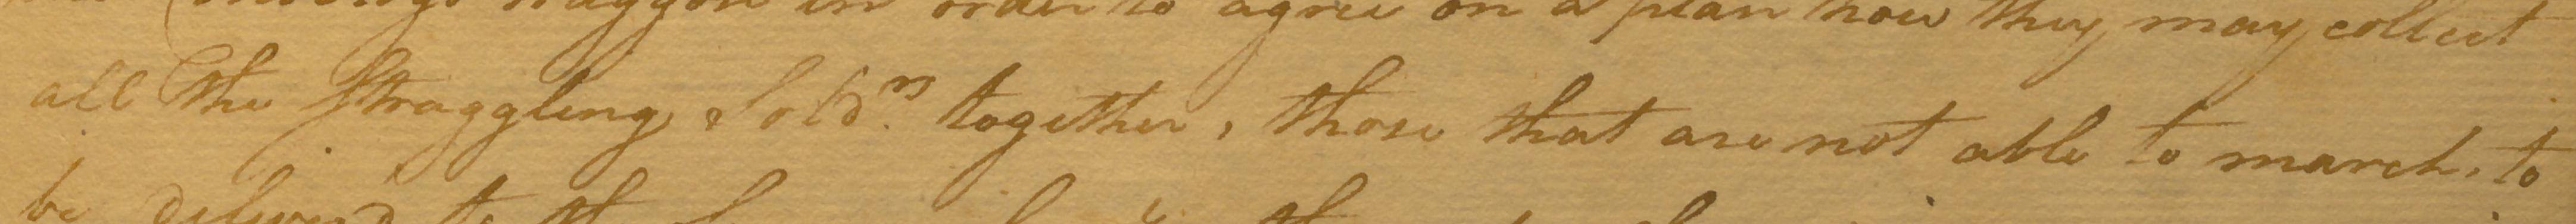all the Straggling Sold^rs. together, those that are not able to march to
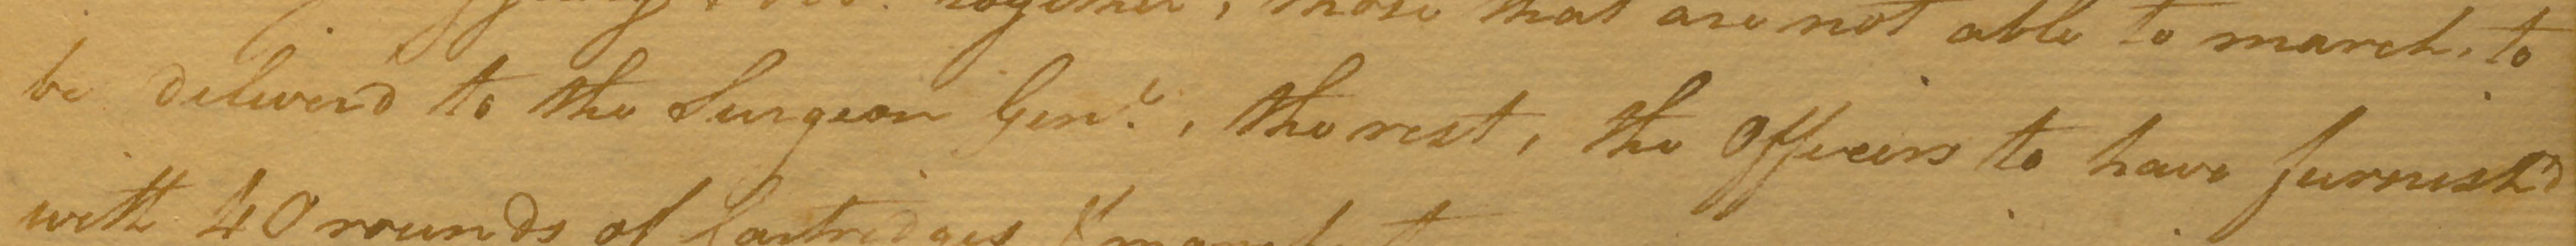be deliver'd to the Surgeon Gen^l., the rest, the officers to have furnish'd
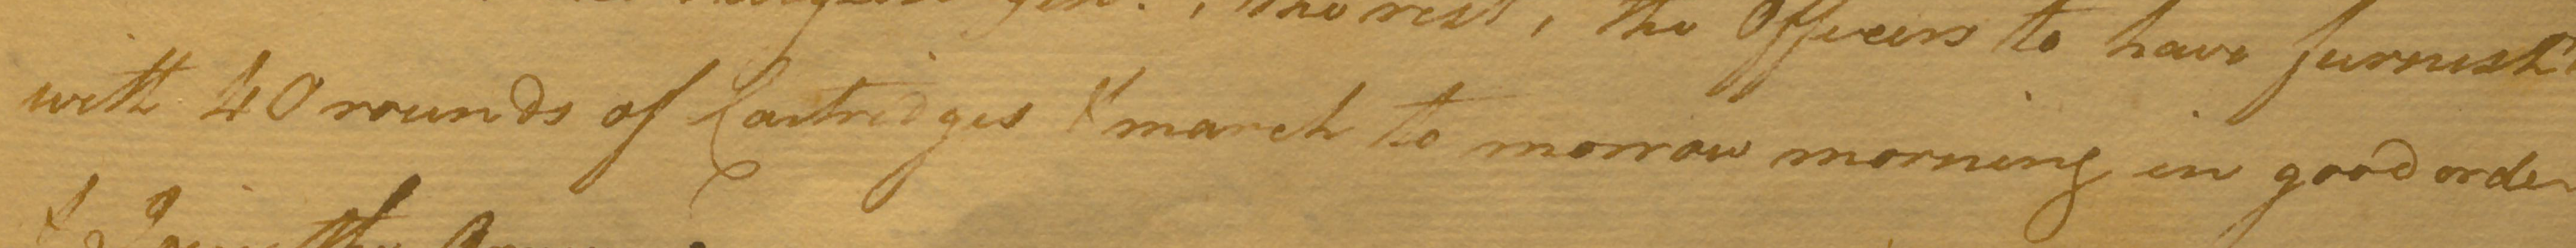with 40 rounds of Cartridges & march to morrow morning in good order
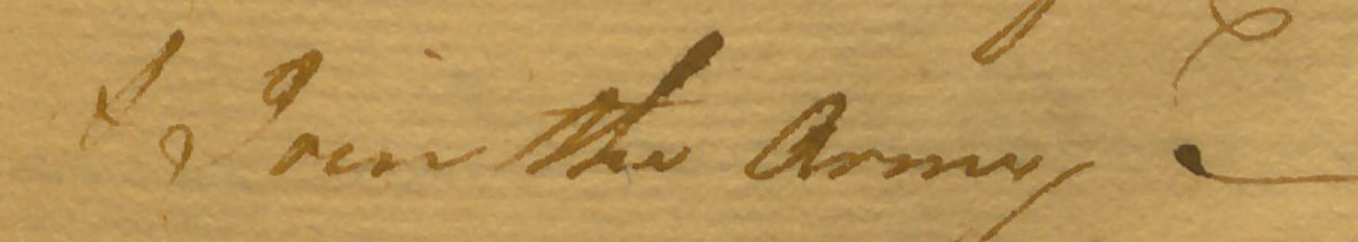& Join the Army.
